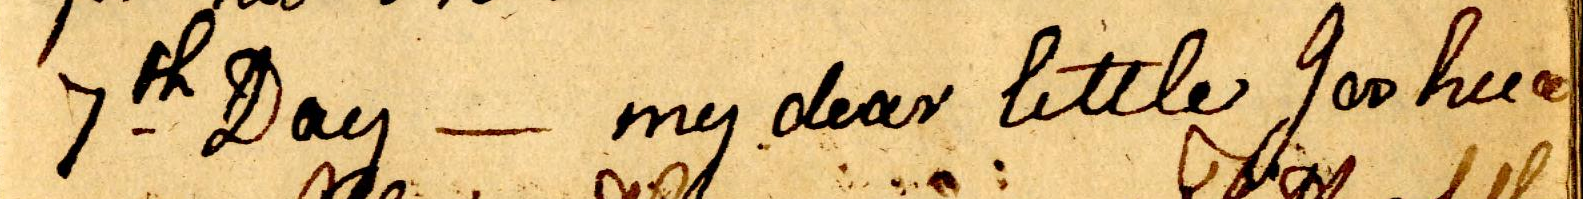7^th Day- my dear little Jos here
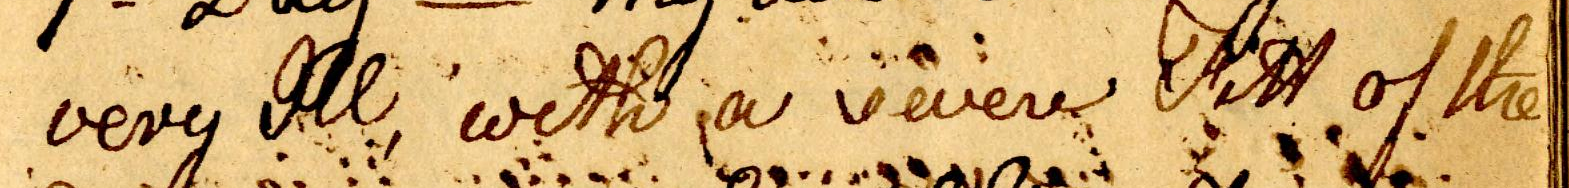very Il, with a severe Fitt of the
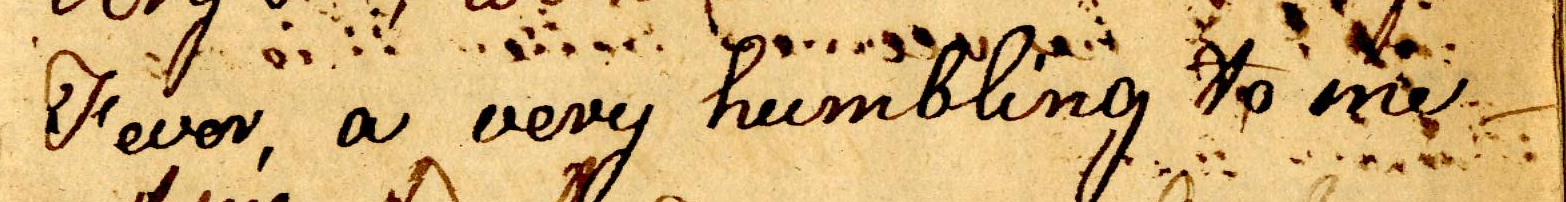Fever, a very humbling to me-
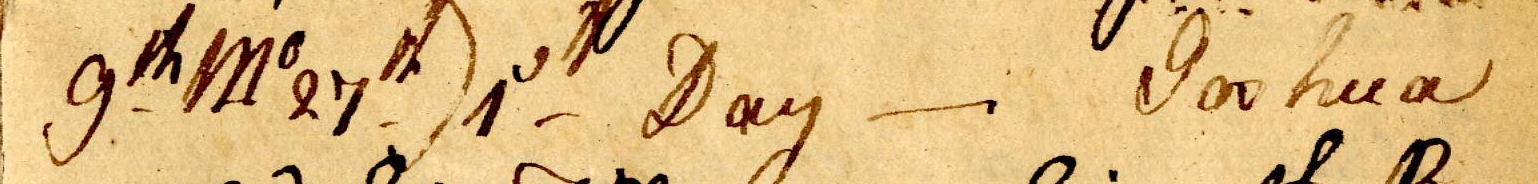9^th M^o 27^th) 1^st Day- Joshua
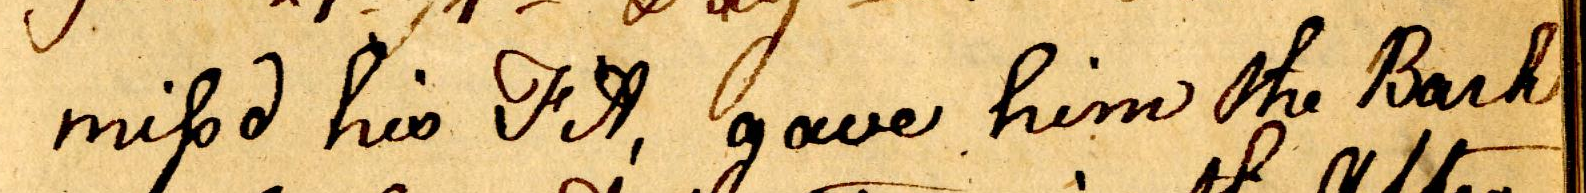missd his Fit, gave him the Bark
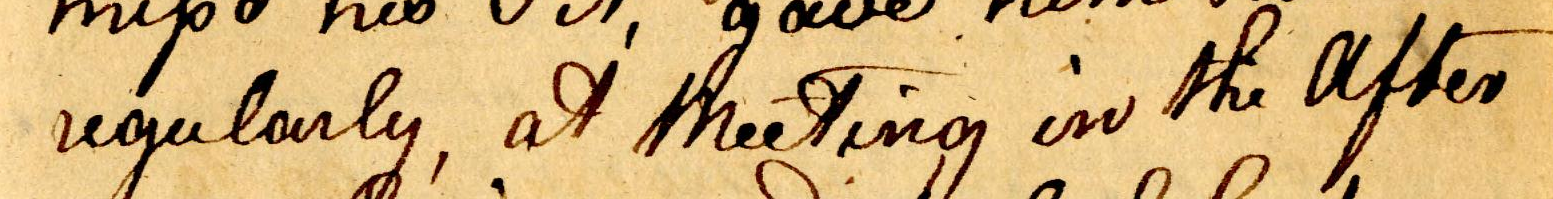regularly, at Meeting in the After
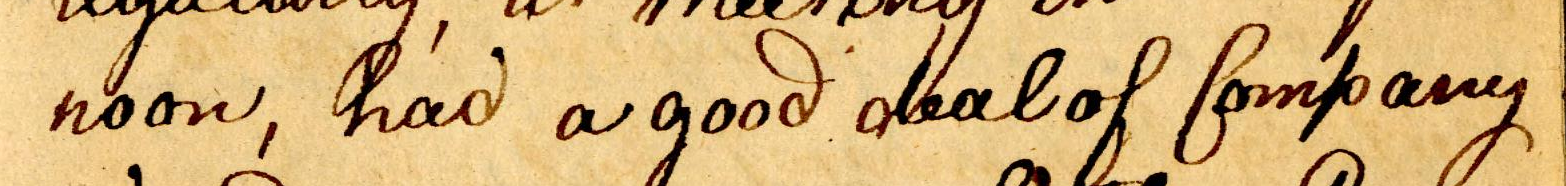noon, had a good deal of Company
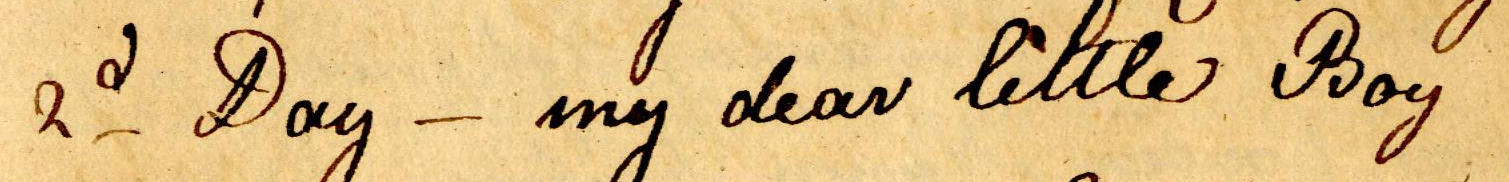2^d Day- my dear little Boy
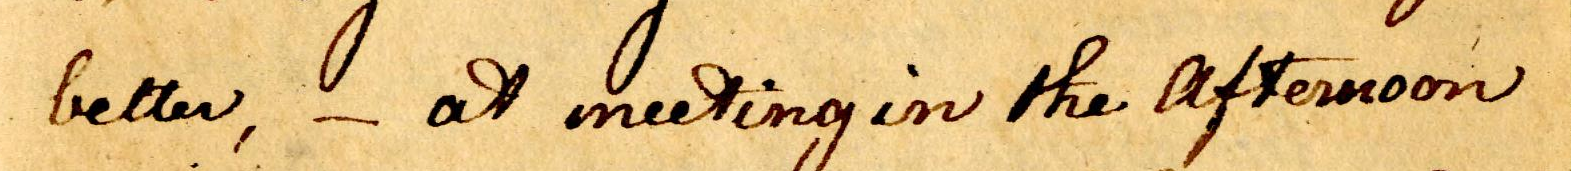better,- at meeting in the Afternoon
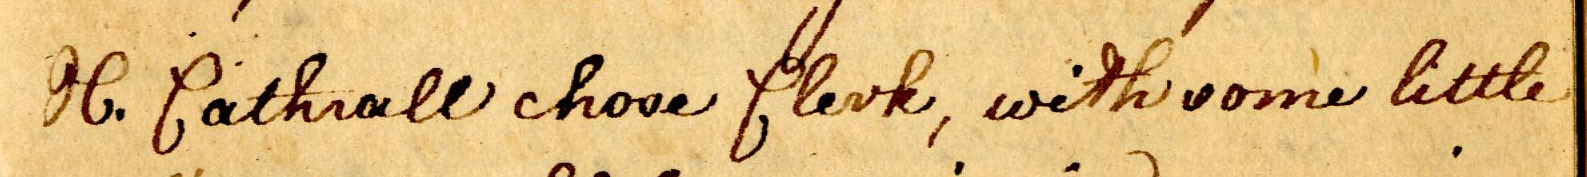H. Cathrall chose Clerk, with some little
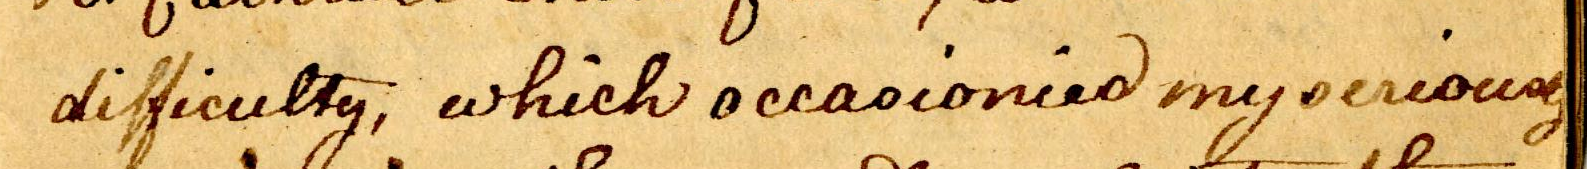difficulty, which occasionied my serious
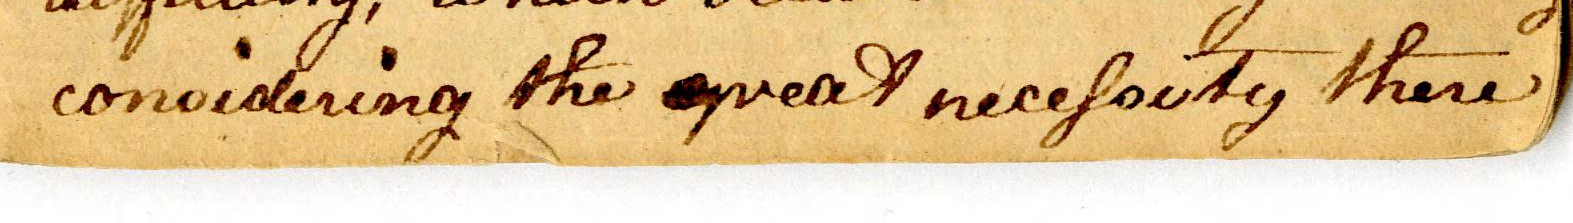considering the great necessity there
